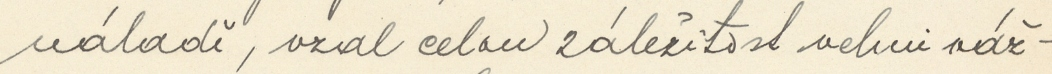náladě, vzal celou záležitost velmi váž-
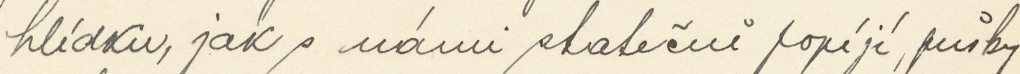hlídku, jak s námi statečně popíjí, pušky
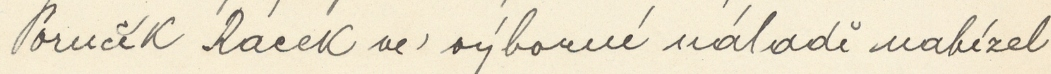Poručík Racek ve výborné náladě nabízel
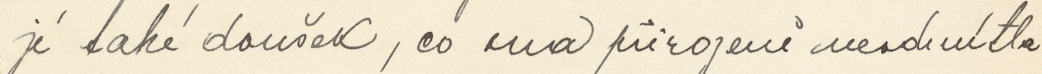jí také doušek, co ona přirozeně neodmítla.
